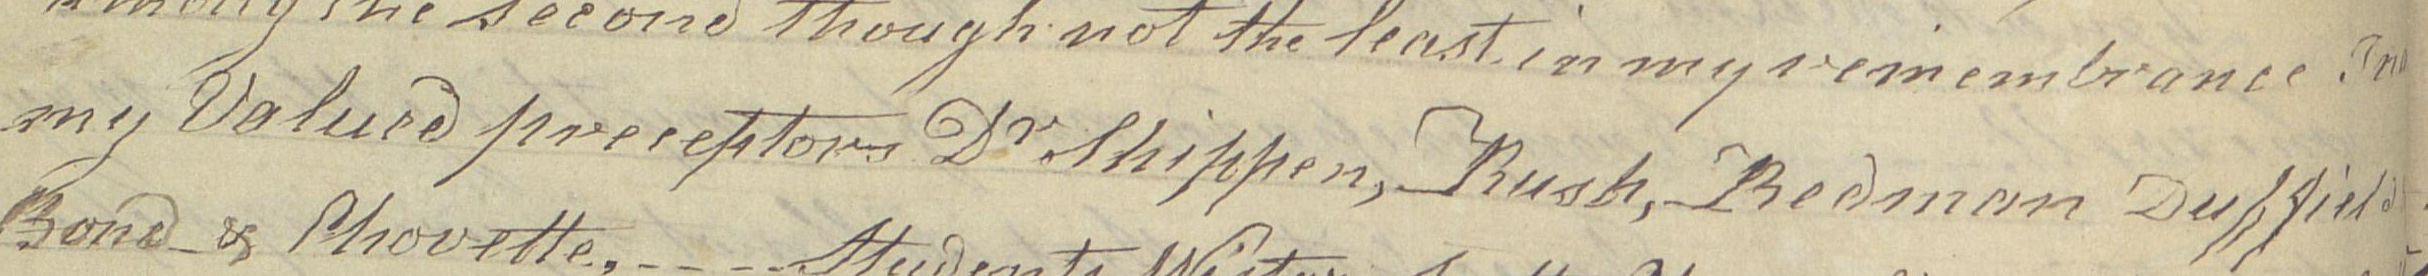my Valued preceptors D^r. Shippen, Rush, Redman Duffield
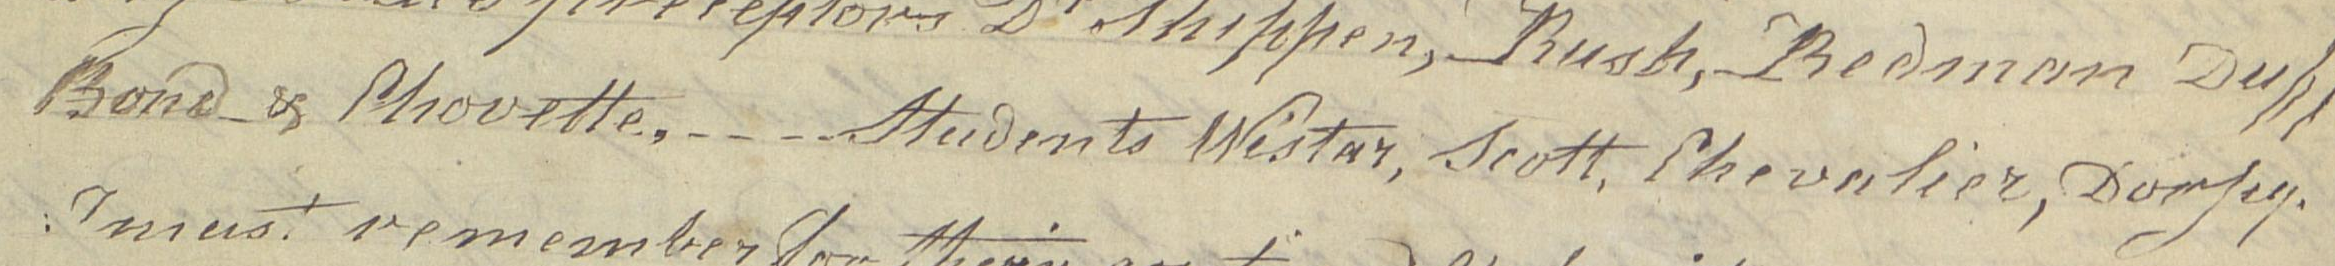Bond & Chovette. Students Wister, Scott, Chevalier, Dorsey.
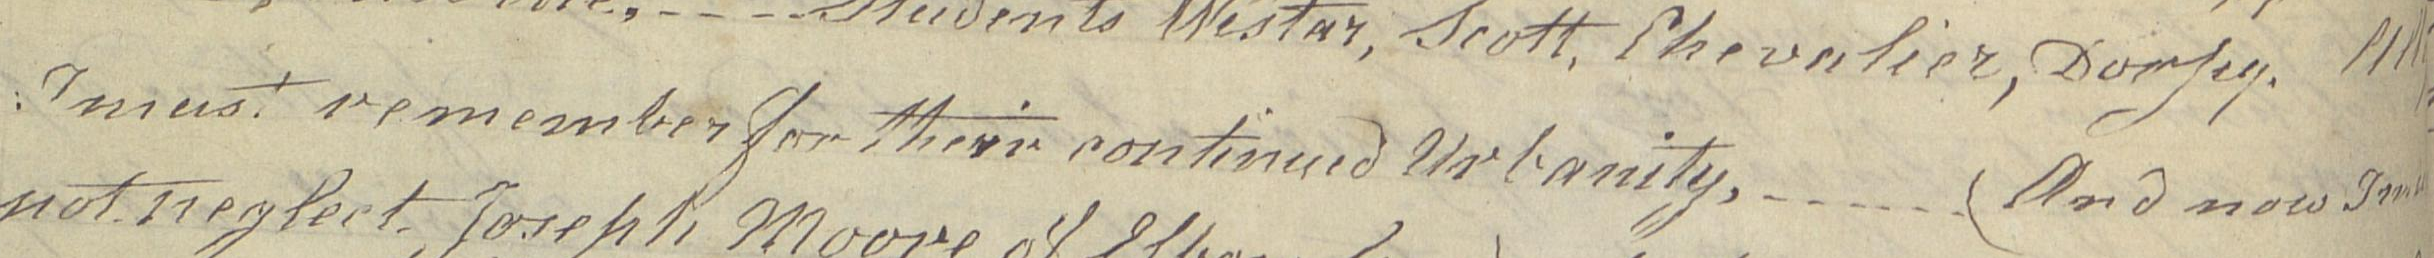I must remember for their continued Urbanity, (And now I m-
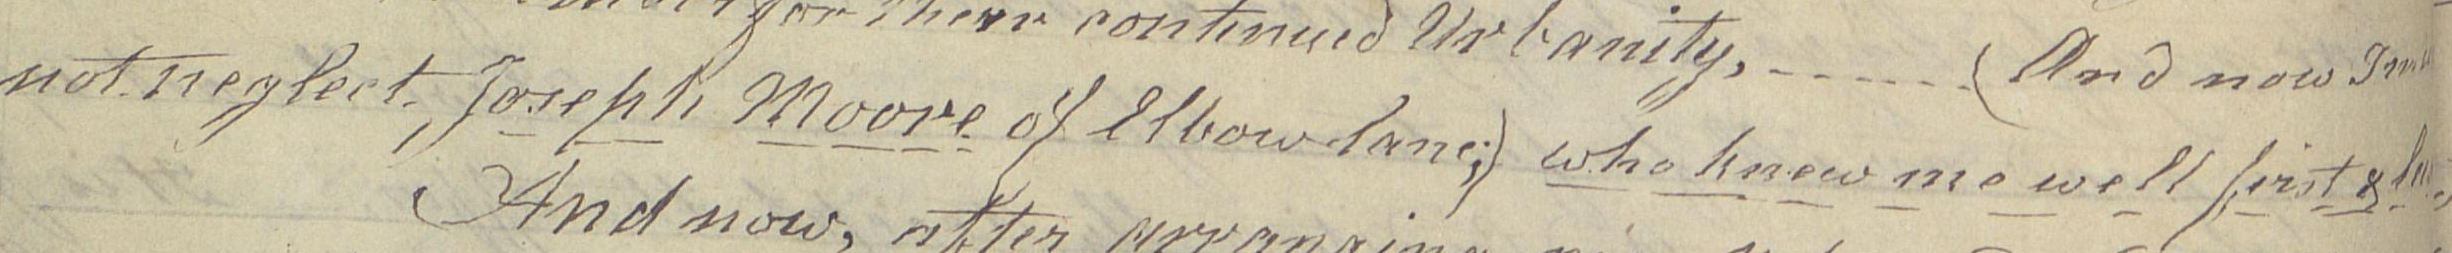not neglect, Joseph Moore of Elbow lane;) who knew me well first & l-
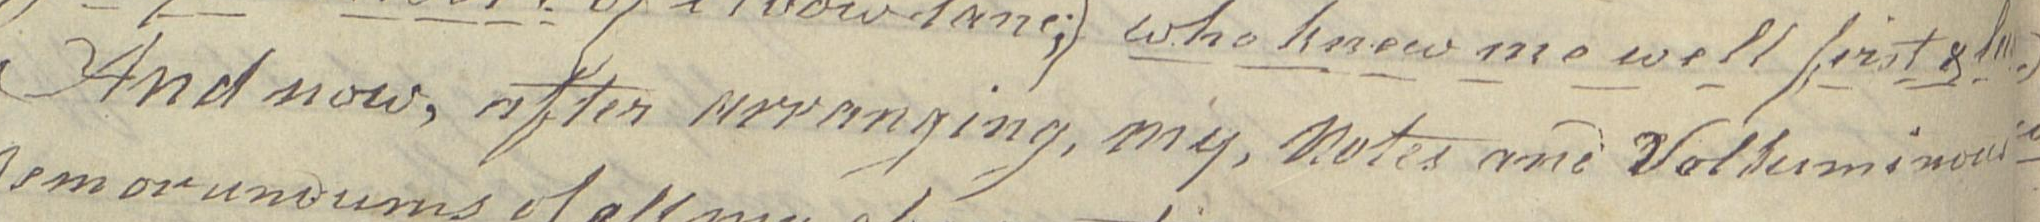And now, after arranging, my, Notes and Volluminous
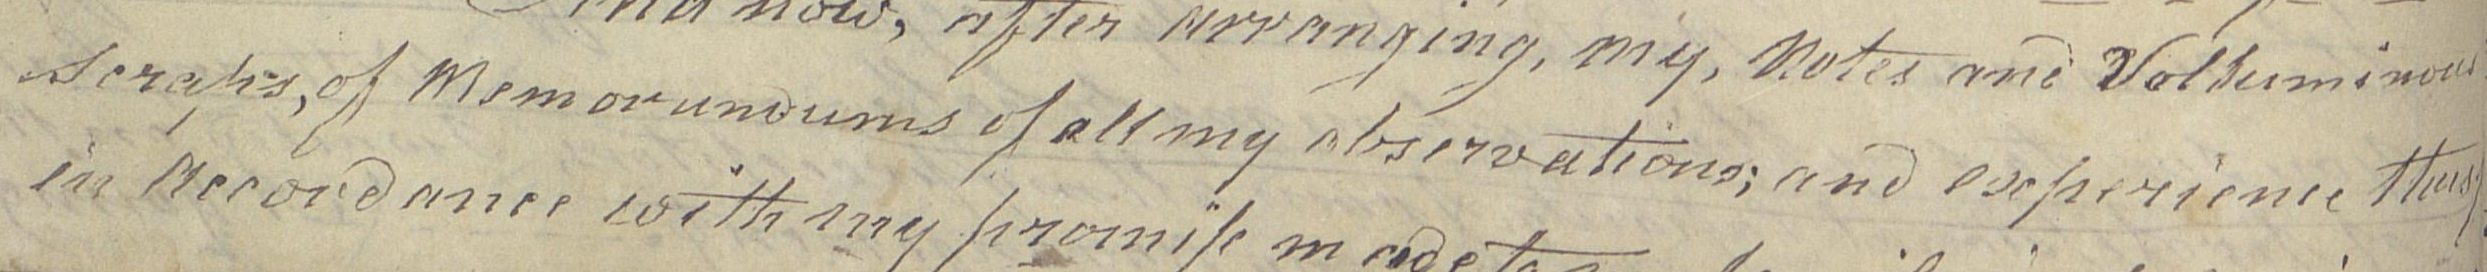Scraps, of Memorandums of all my observations; and experience thus
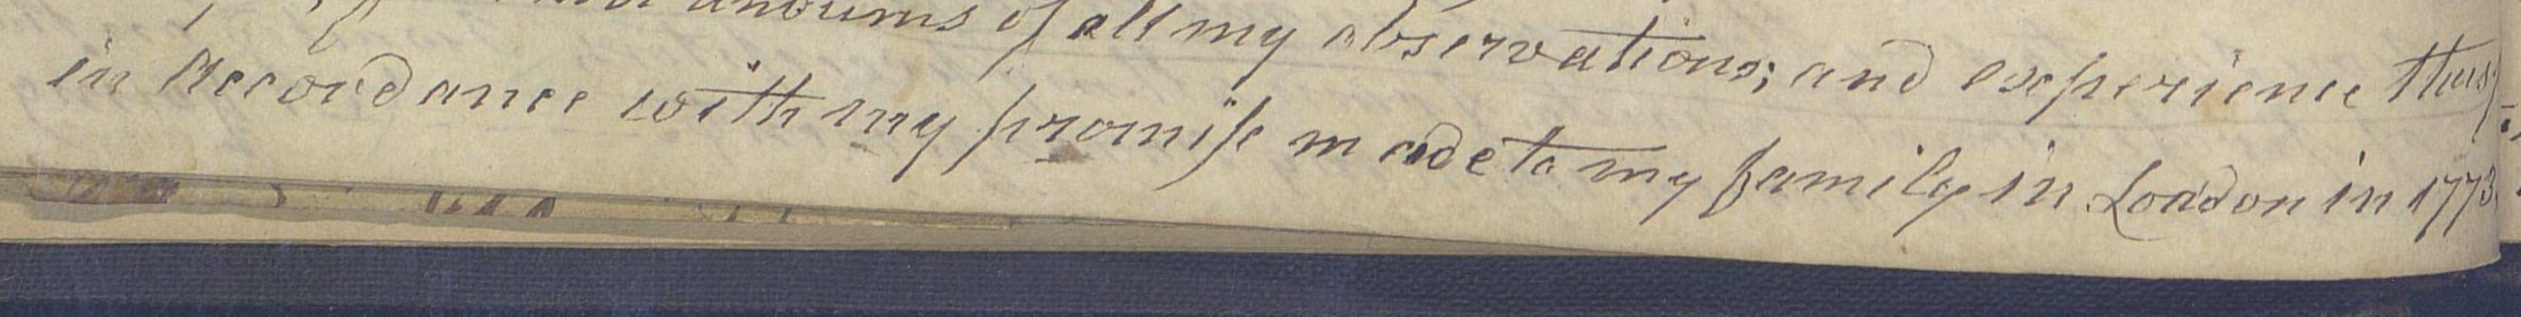in accordance with my promise made to my family in London in 1773
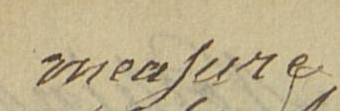measure
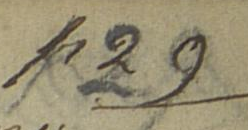p 29
